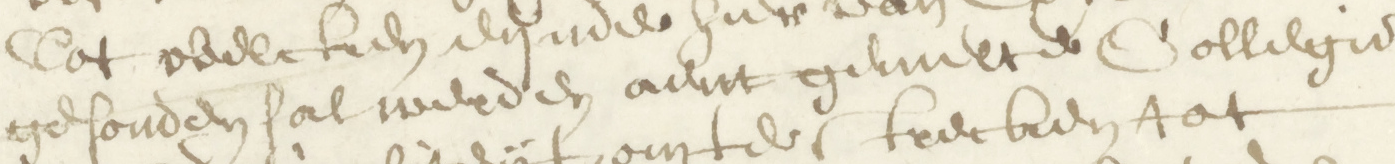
gesonden sal werden aent gemelte Collegie
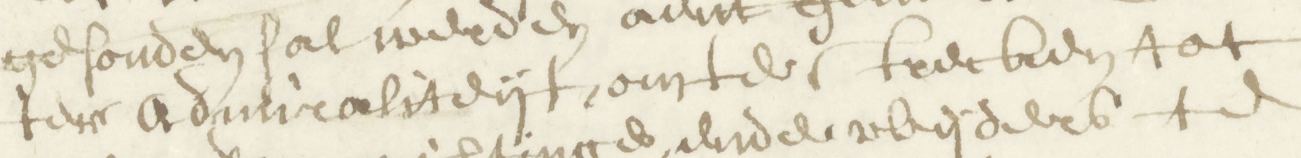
ter Admiraliteijt, om te strecken tot
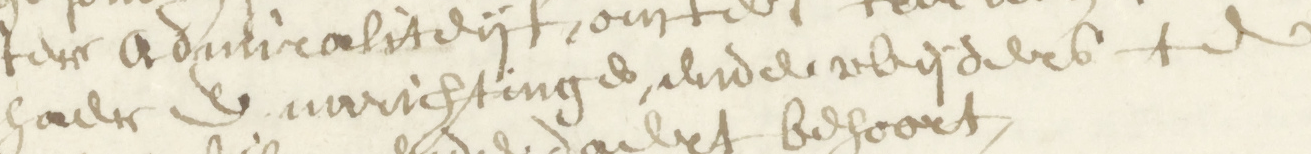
haer E. narichtinge, ende wijders te
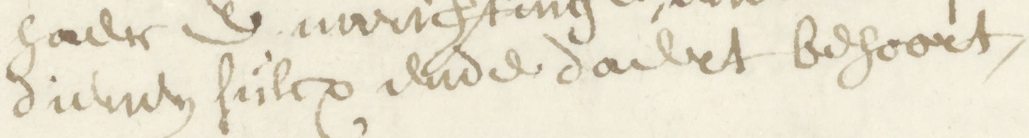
dienen sulcx ende daert behoort,
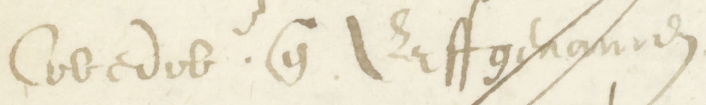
wedwe. & Erffgenlamen.
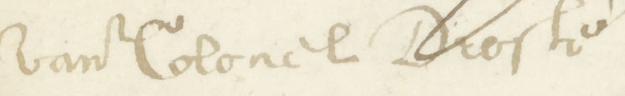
van Colonel Droste
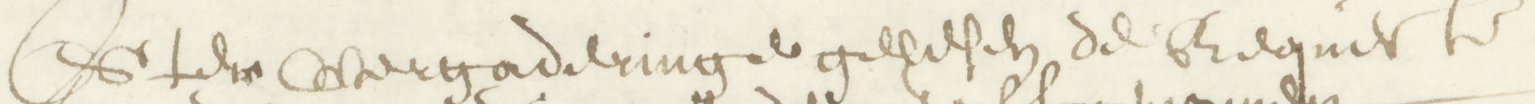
Is ter Vergaderinge gelesen de Requeste
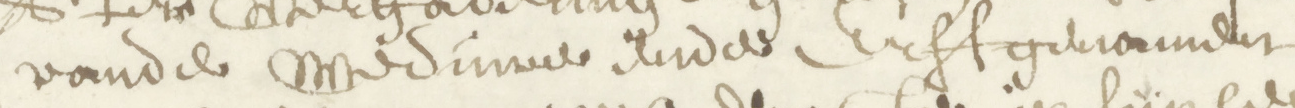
vande Weduwe ende Erffgenamen
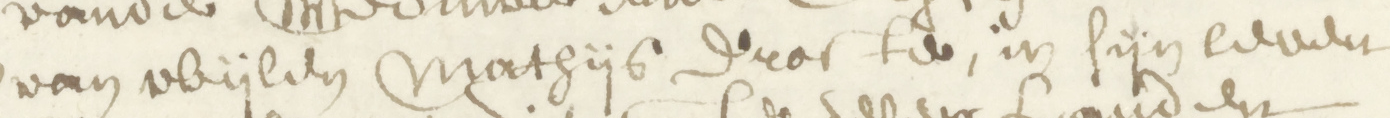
van wijlen Mathijs Droste, in sijn leven
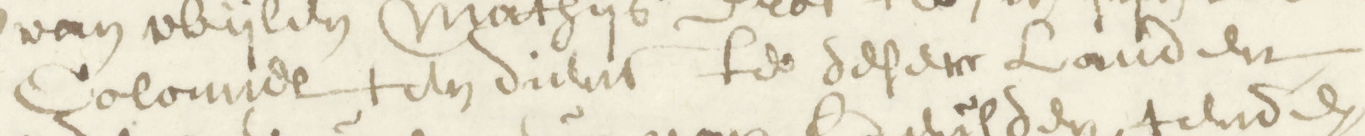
Colonnel ten dienste deser Landen
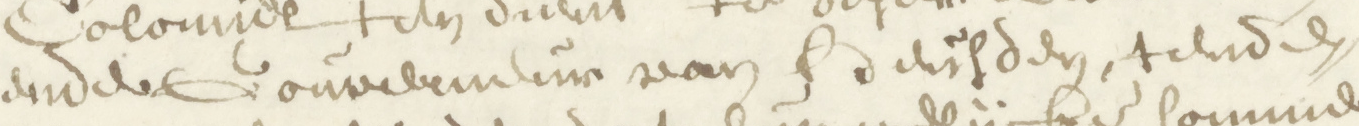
ende Gouverneur van Heusden, tende„
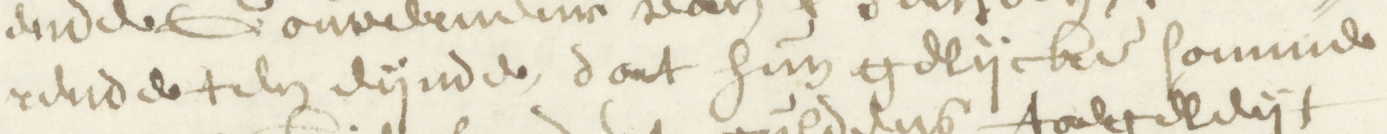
rende ten eijnde, dat hun gelijcke somme
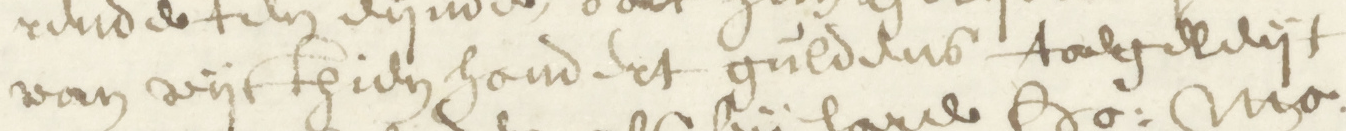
van vijfthien hondert guldens toegeleijt
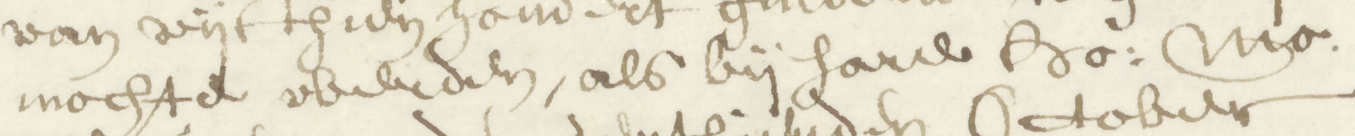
mochte werden, als bij hare Ho:Mo:
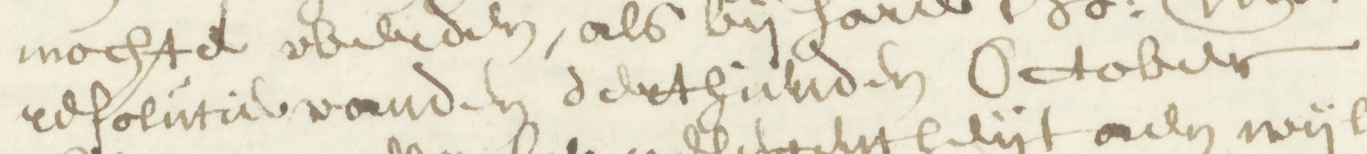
resolutie vanden derthienden October
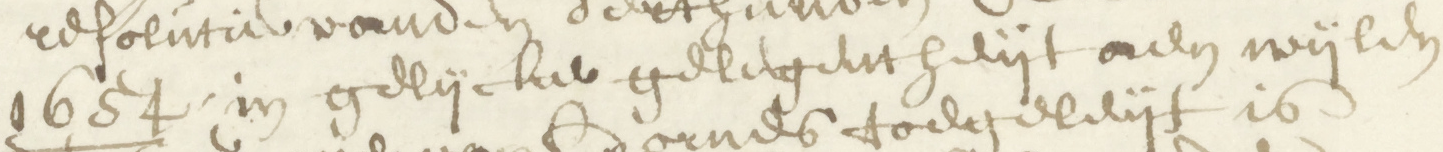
1654. in gelijcke gelegentheijt aen wijlen
